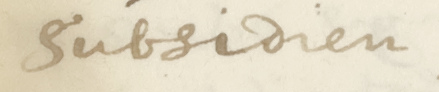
subsidien
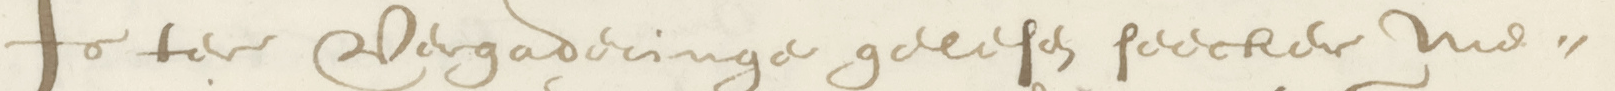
Is ter Vergaderinge gelesen seecker me„
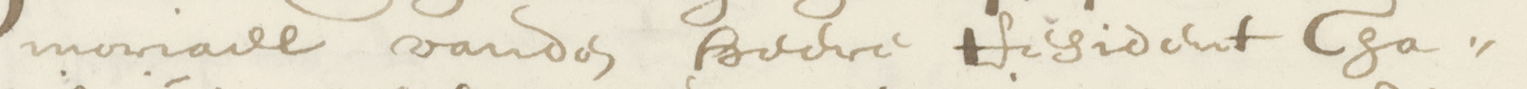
moriael vanden heere Resident Cha„
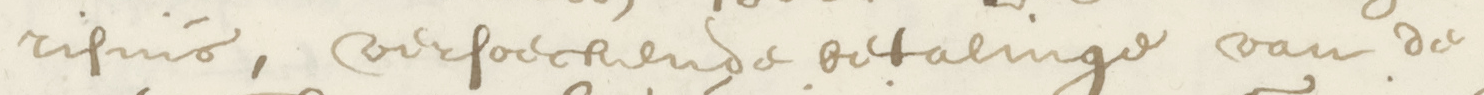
risius, versoeckende betalinge van de
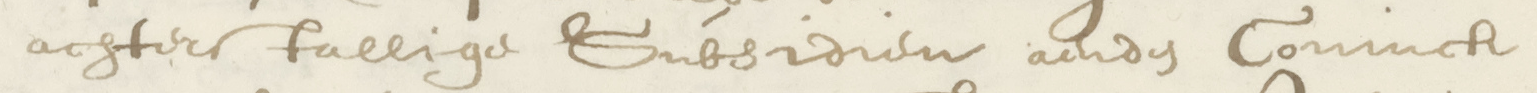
achterstallige Subsidien aenden Coninck
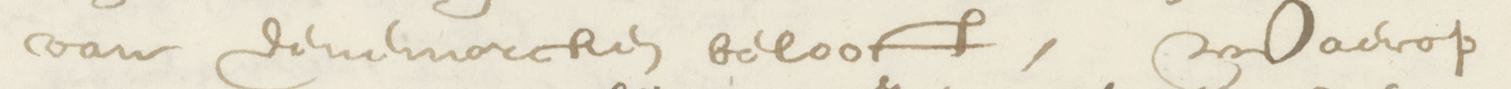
van Denemarcken belooft, Waerop
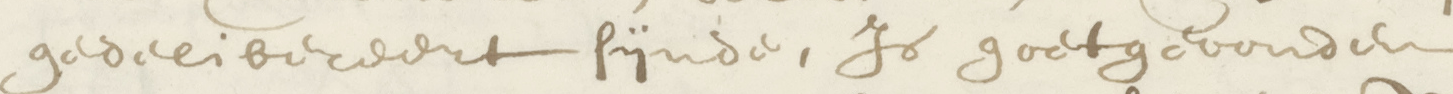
gedelibereert sijnde, is goetgevonden
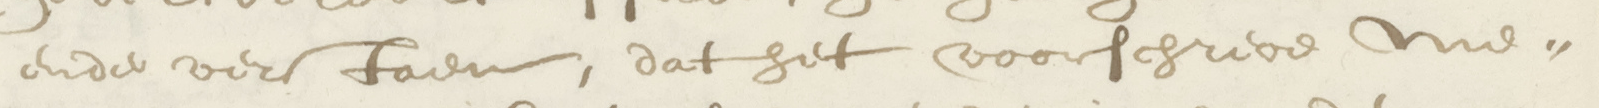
ende verstaen, dat het voorschreve me„
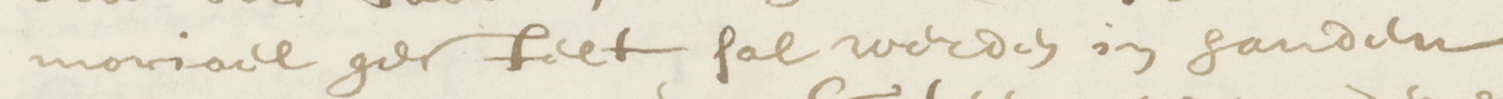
moriael gestelt sal werden in handen
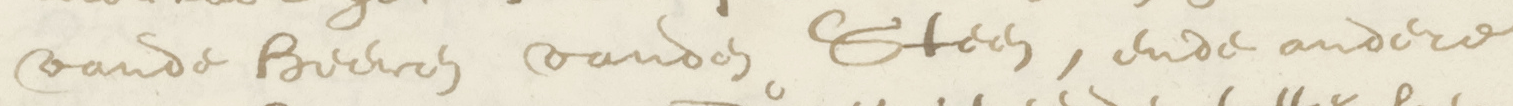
vande heeren vanden Steen, ende andere
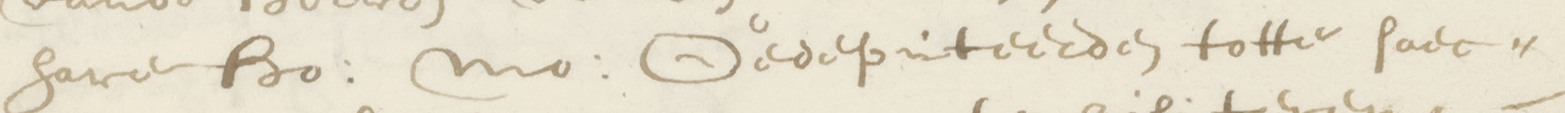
hare Ho:Mo: Gedeputeerden totte saec„
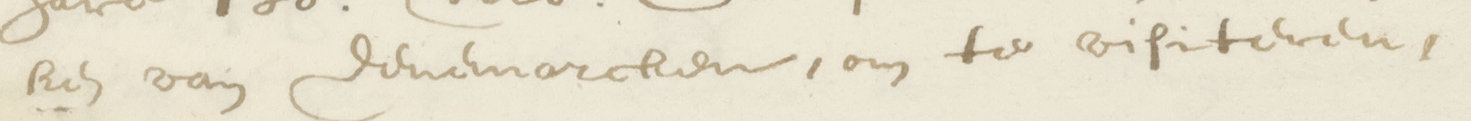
ken van Denemarcken, om te visiteren,
